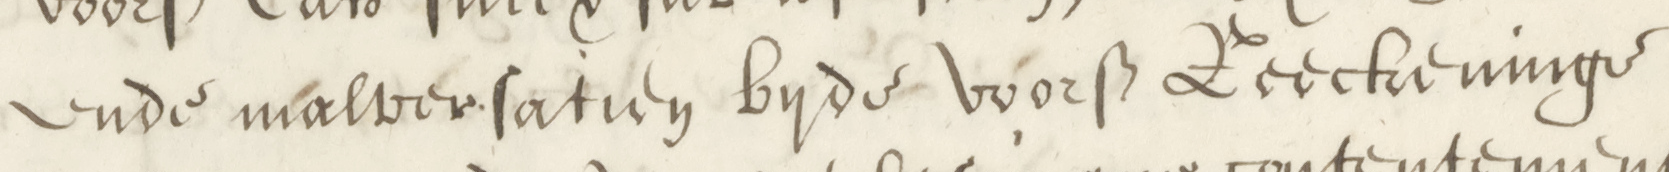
ende malversatien byde voors Reeckeninge
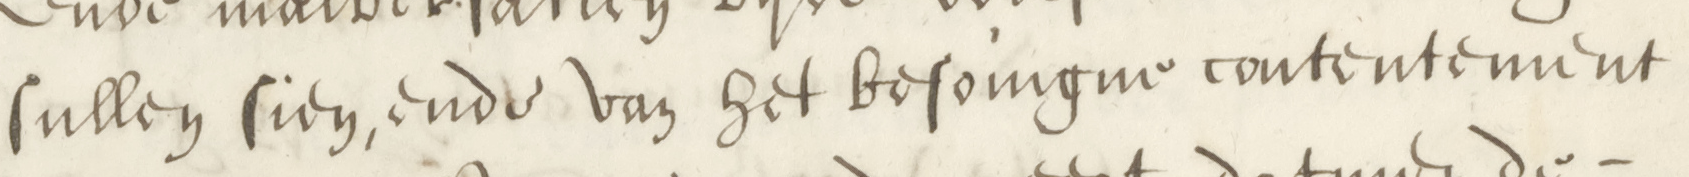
sullen sien, ende van het besoingne contentement
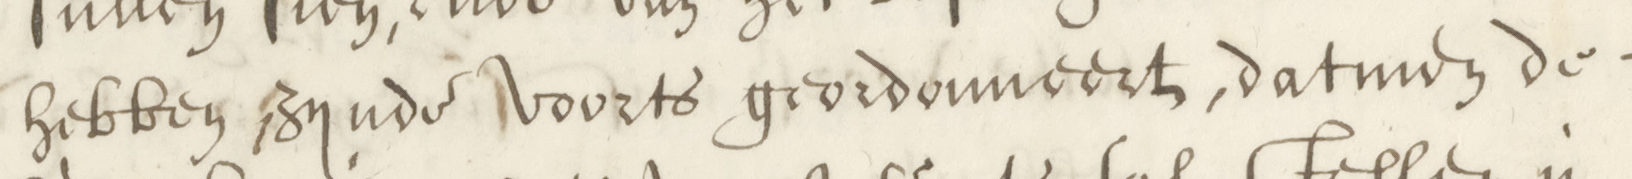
hebben, zynde voorts geordonneert, datmen de -
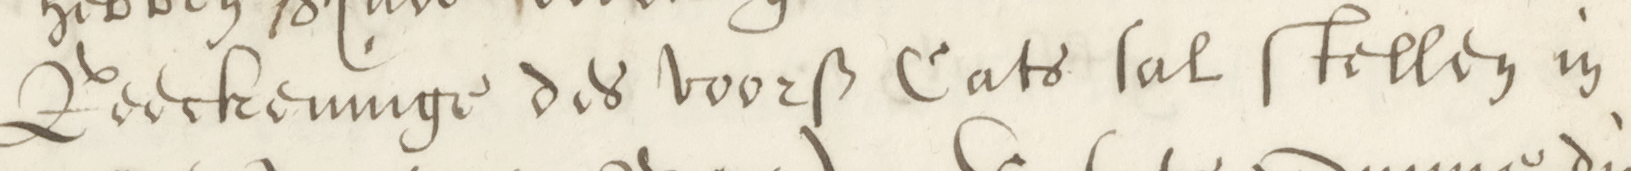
Reeckeninge des voors Cats sal stellen in
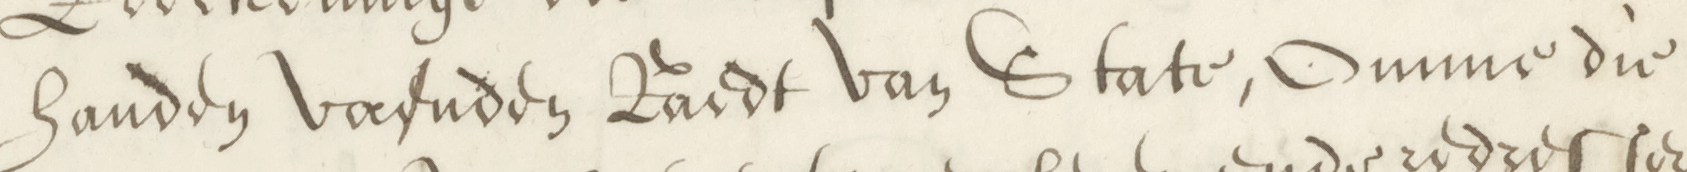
handen vaenden Raedt van State, Omme die
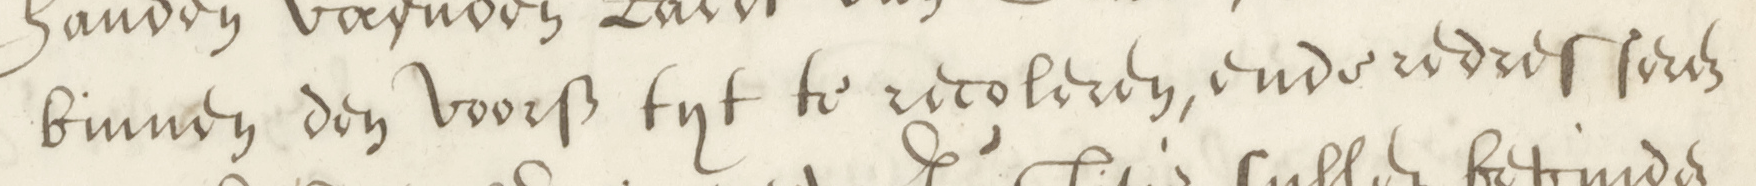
binnen den voors tyt te recoleren, ende redresseren,
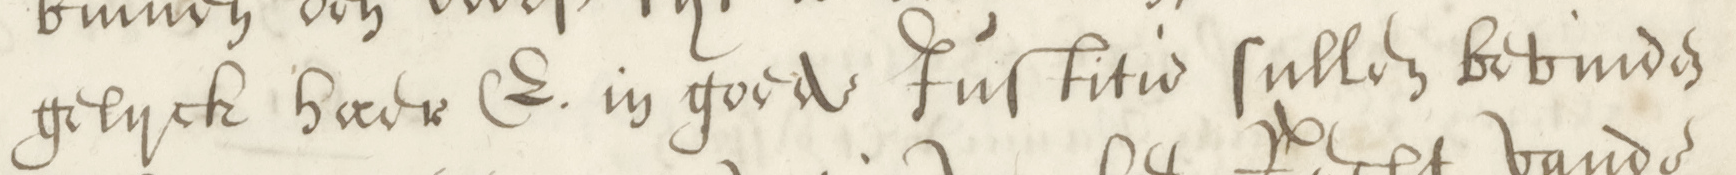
gelyck haer E. in goede Justitie sullen bevinden
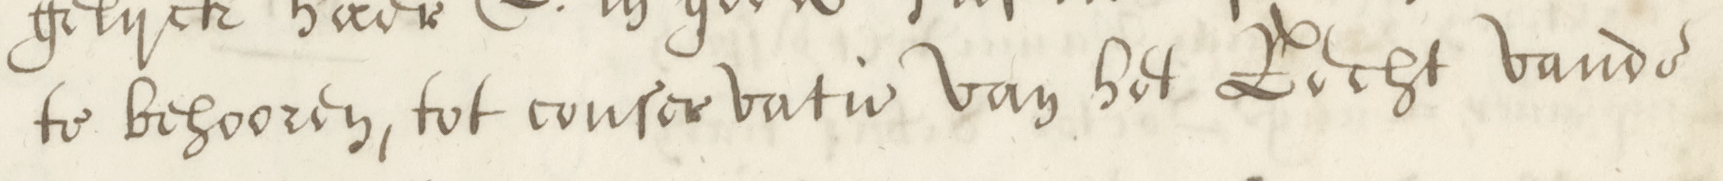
te behooren, tot conservatie van het Recht vande
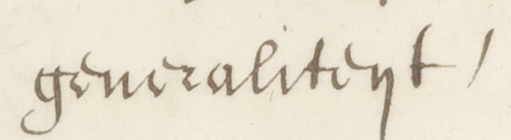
generaliteyt.
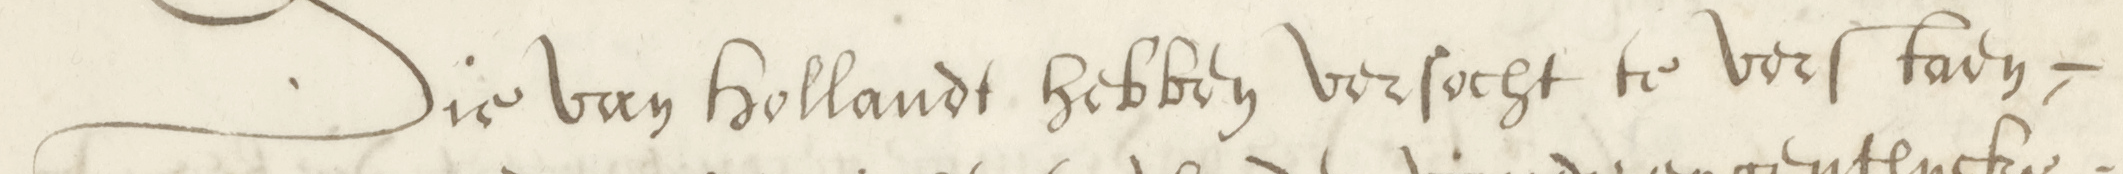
Die van Hollandt hebben versocht te verstaen, -
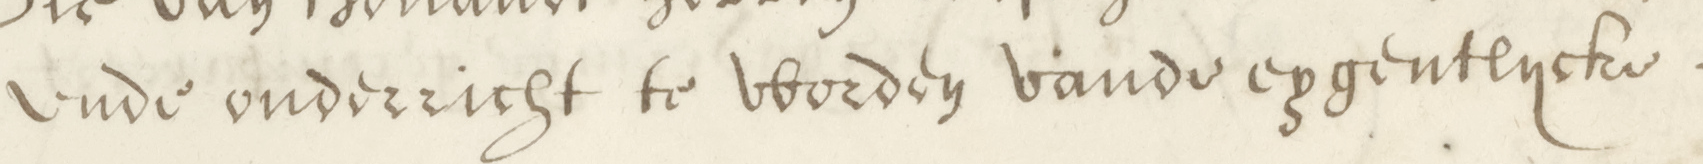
ende onderricht te worden vande eygentlycke
